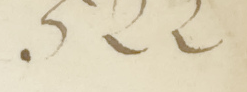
522
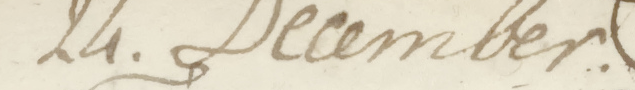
24. December.
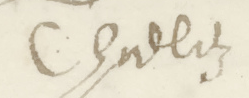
Thielen
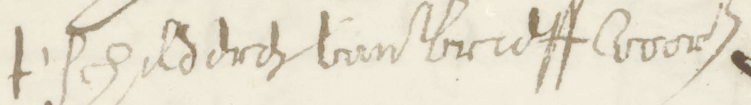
t' schilderen van brieff voors
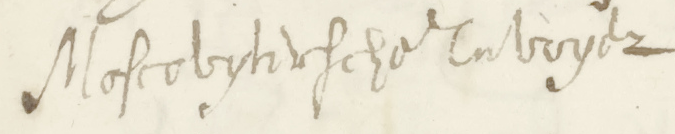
Moscovytersche Envoijez
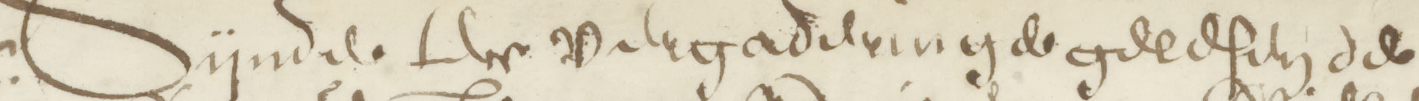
Sijnde ter Vergaderinge gelesen de
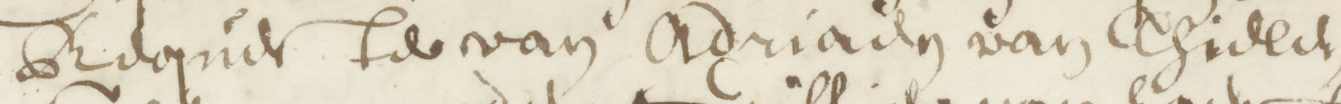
Requeste van Adriaen van Thielen,
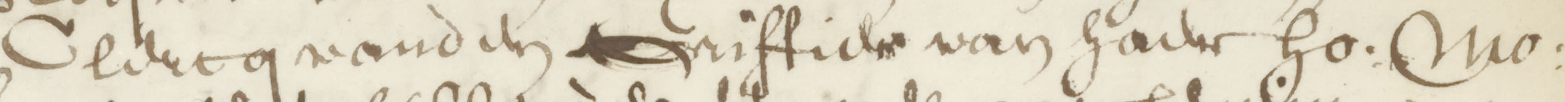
Clercq vanden Griffier van haer Ho:Mo:
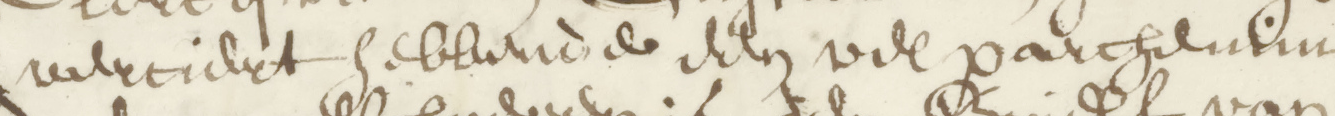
verciert hebbende een vel parchemin
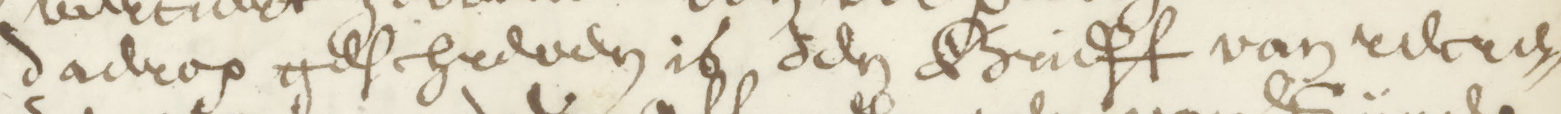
daerop geschreven is, den Brieff van recre„
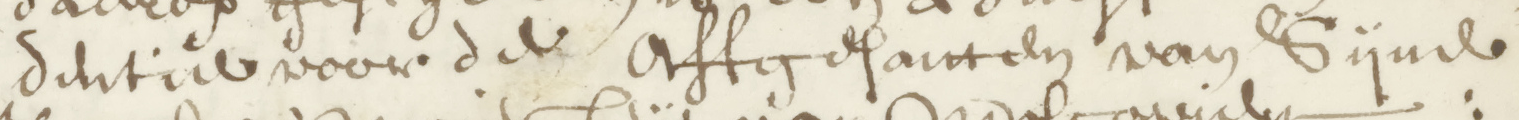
dentie voor de Affgesanten van Sijne
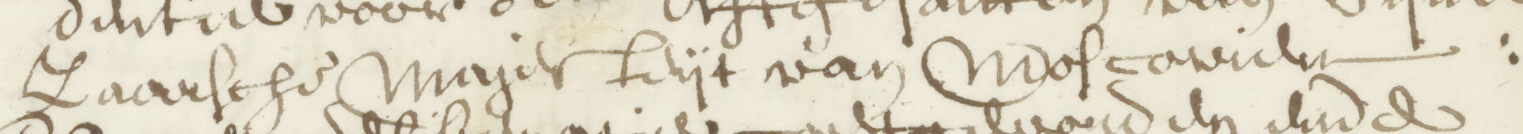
Zaarsche Majesteijt van Moscovien:
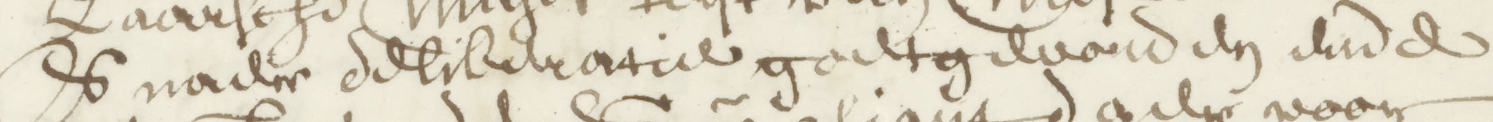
Is naer deliberatie goetgevonden ende
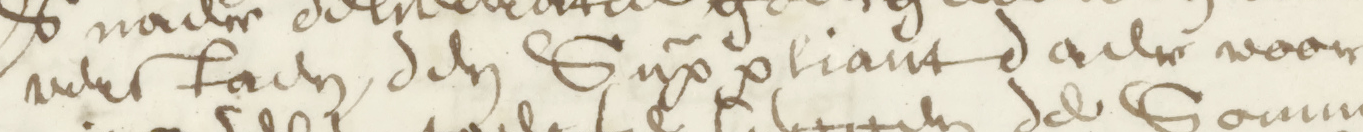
verstaen, den Suppliant daer voor
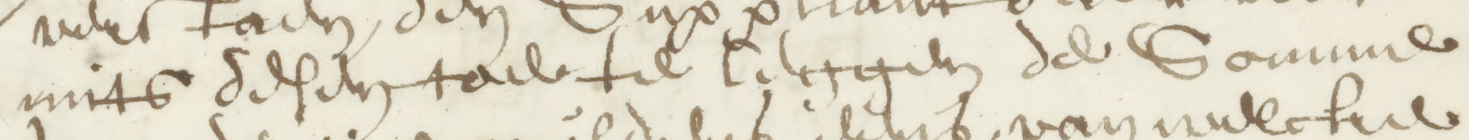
mits desen toe te leggen de Somme
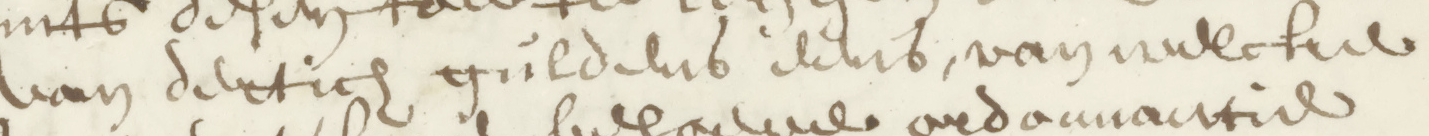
van dertich guldens eens, van welcke
